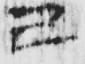己
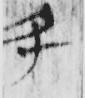丑
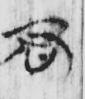君
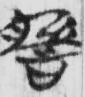䌛
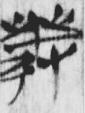○（發）
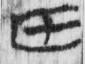甲
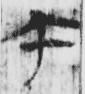午
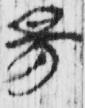昜（陽）
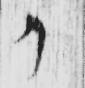人
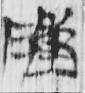陳
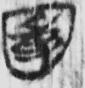圑
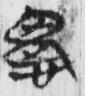愄（威）
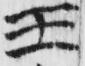王
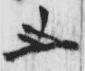之
